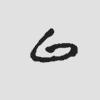㠯（以）
